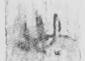卅
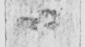四
